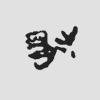敢
